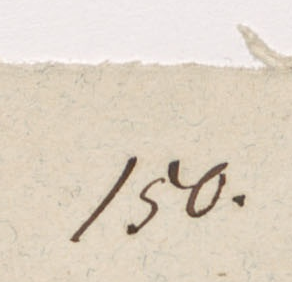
150.
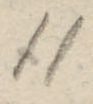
11
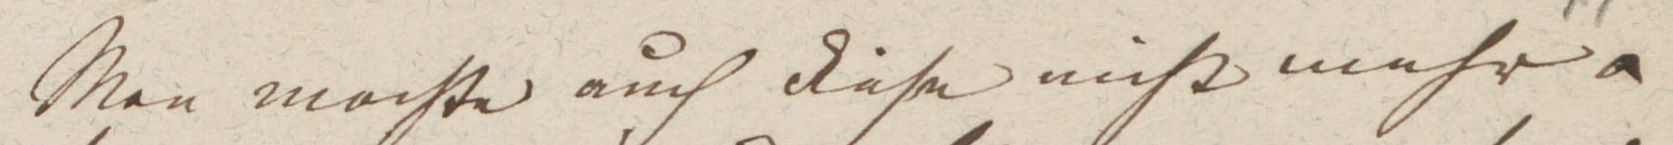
Man mochte auch diese nicht mehr
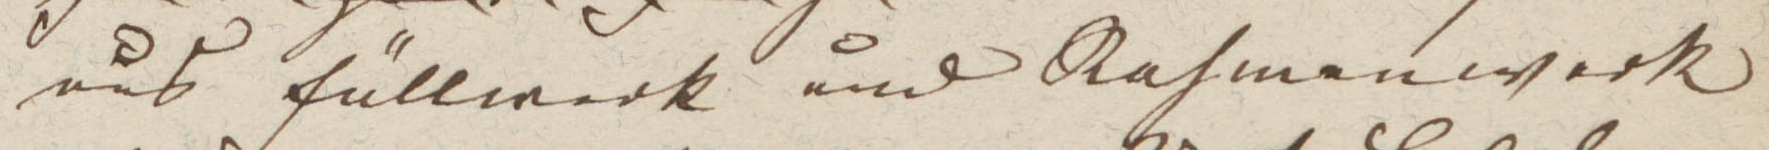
aus Füllwerk und Rahmenwerk
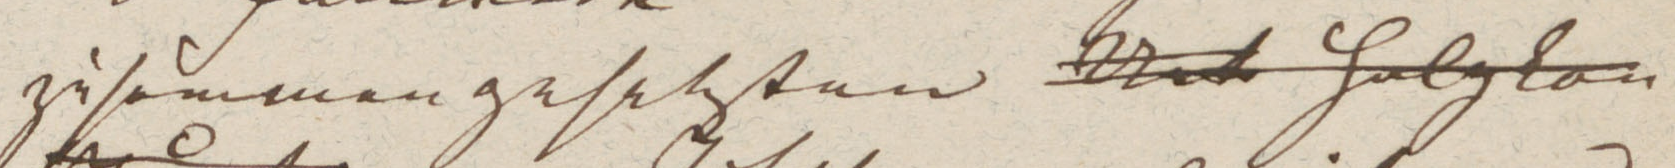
zusammengesetzten Unt Holzkon-
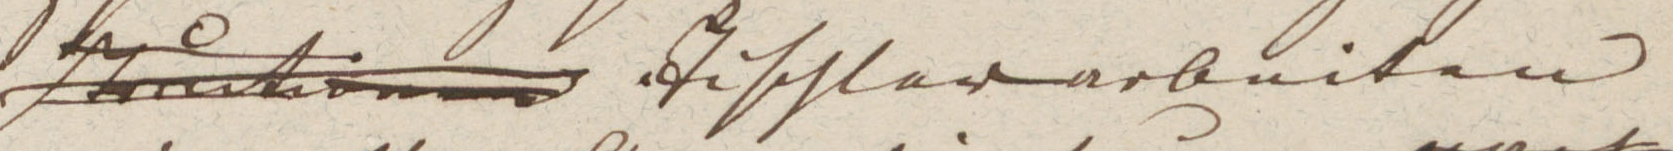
structionen Tischlerarbeiten
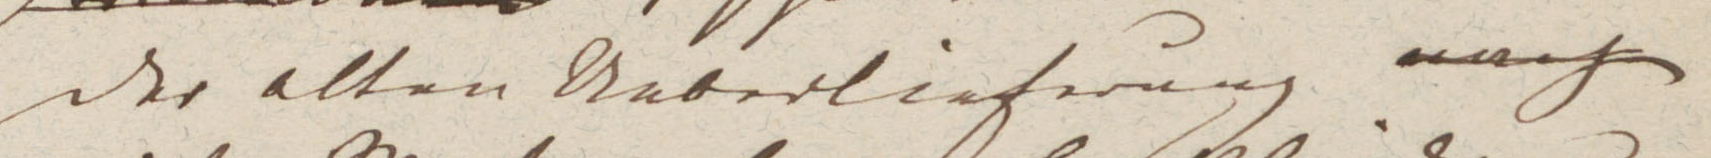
der alten Ueberlieferung nach
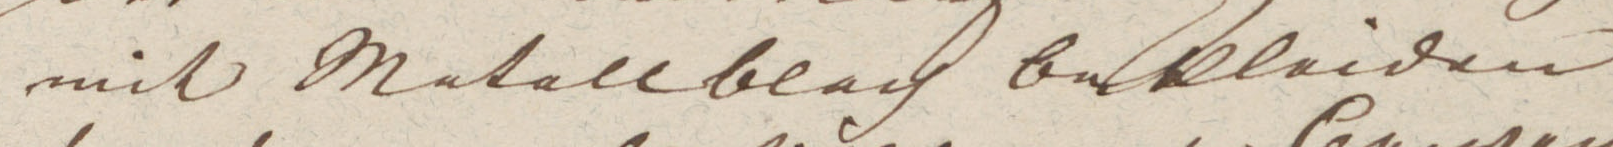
mit Metallblech bekleiden
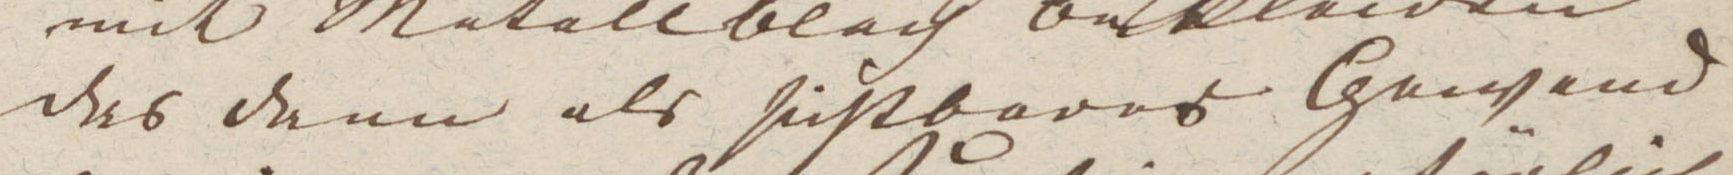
das dann als sichtbarers Gewand
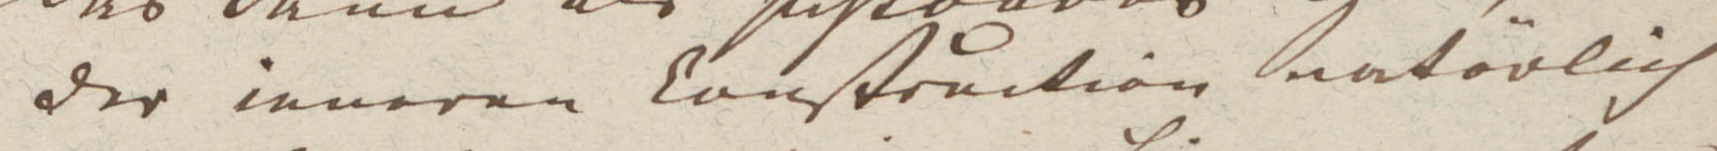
der inneren Construction natürlich
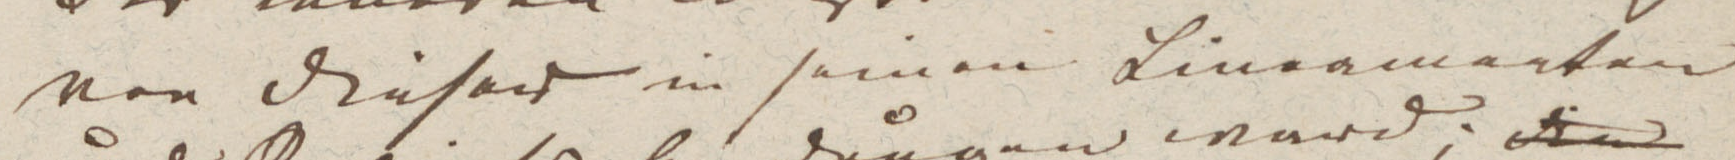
von dieser in seinen Lineamenten
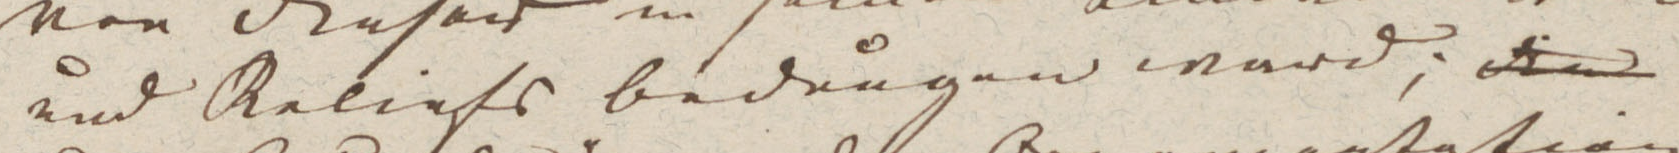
und Reliefs bedungen ward; die
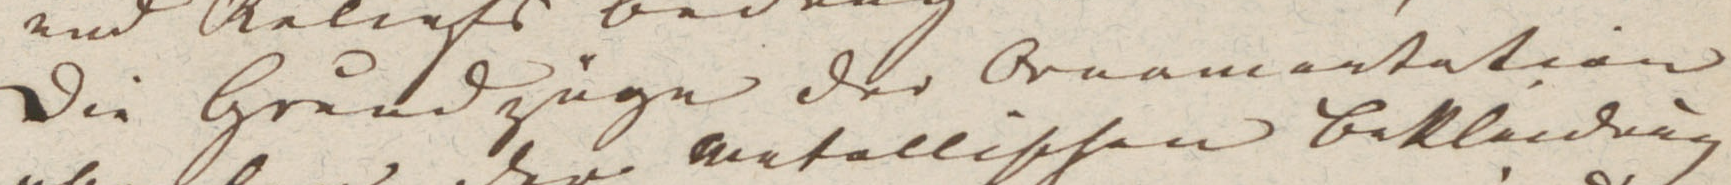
dDie Grundzüge der Ornamentation
